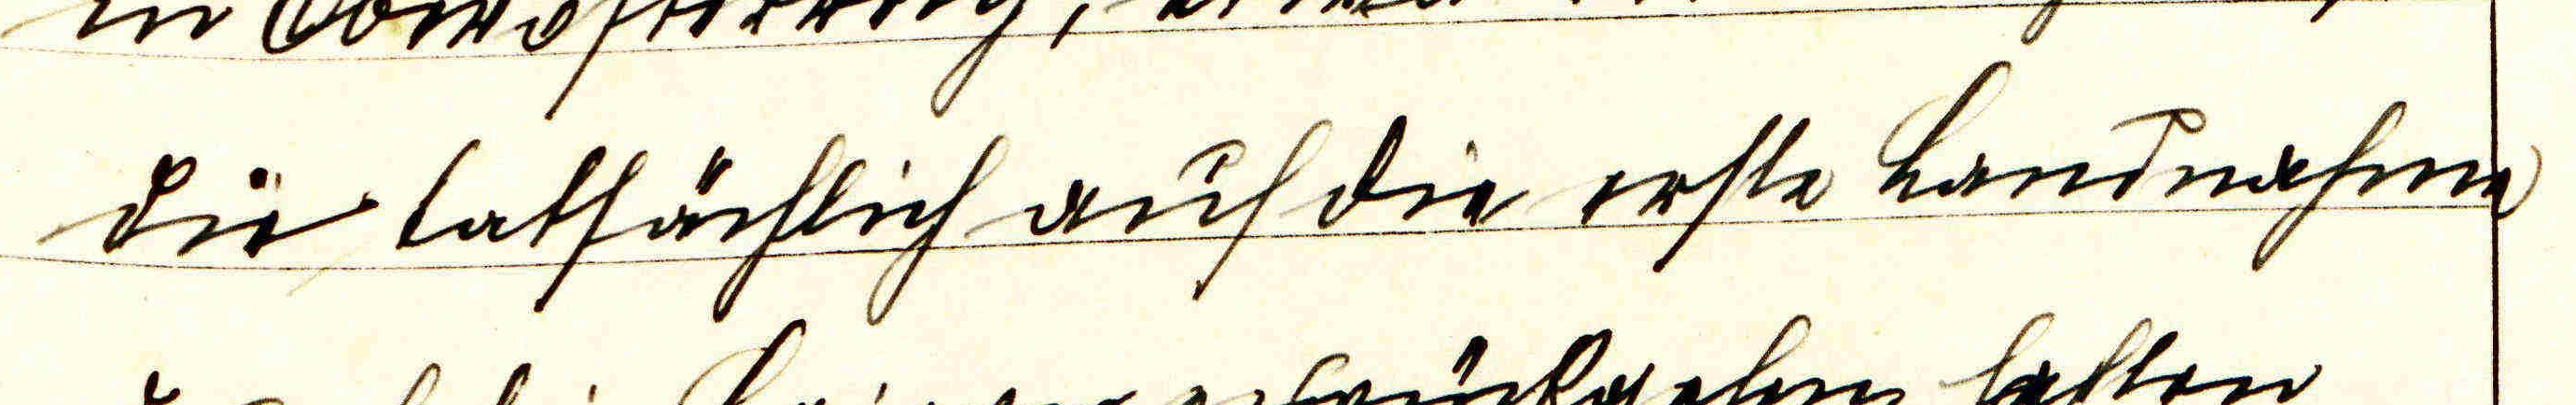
die tatsächlich auf die erste Landnahme
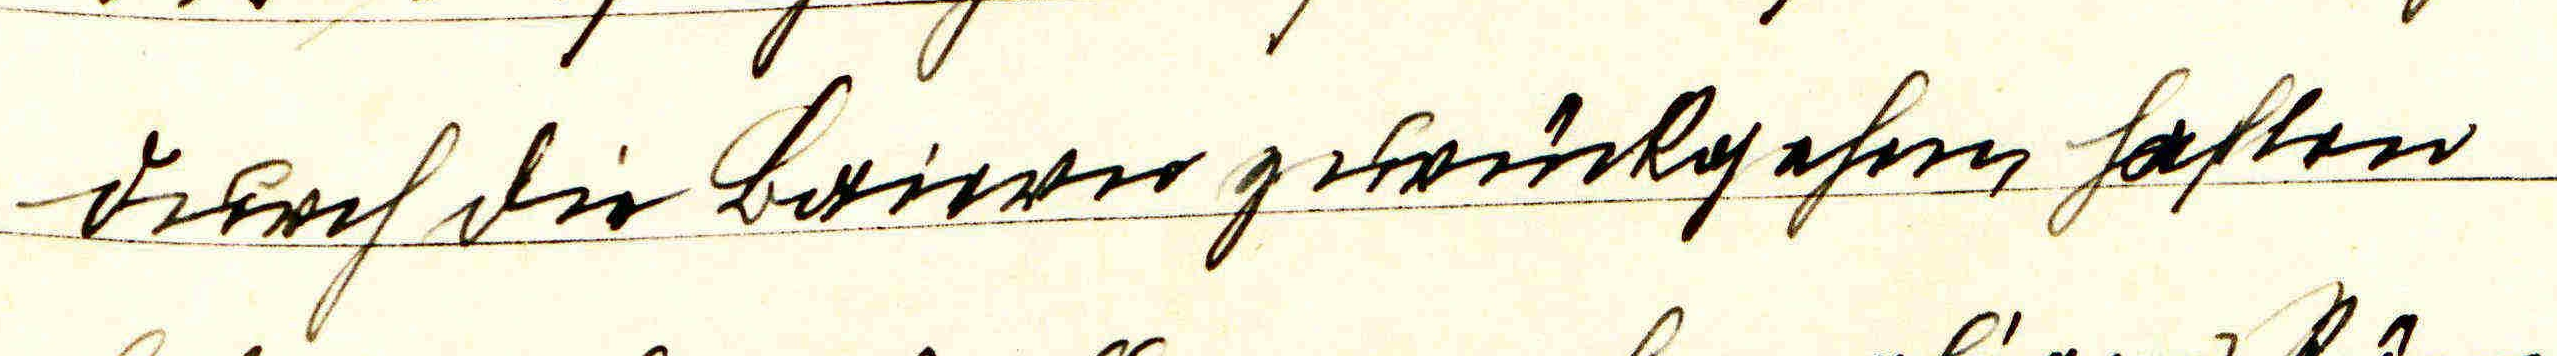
durch die Baiern zurückgehen, haften
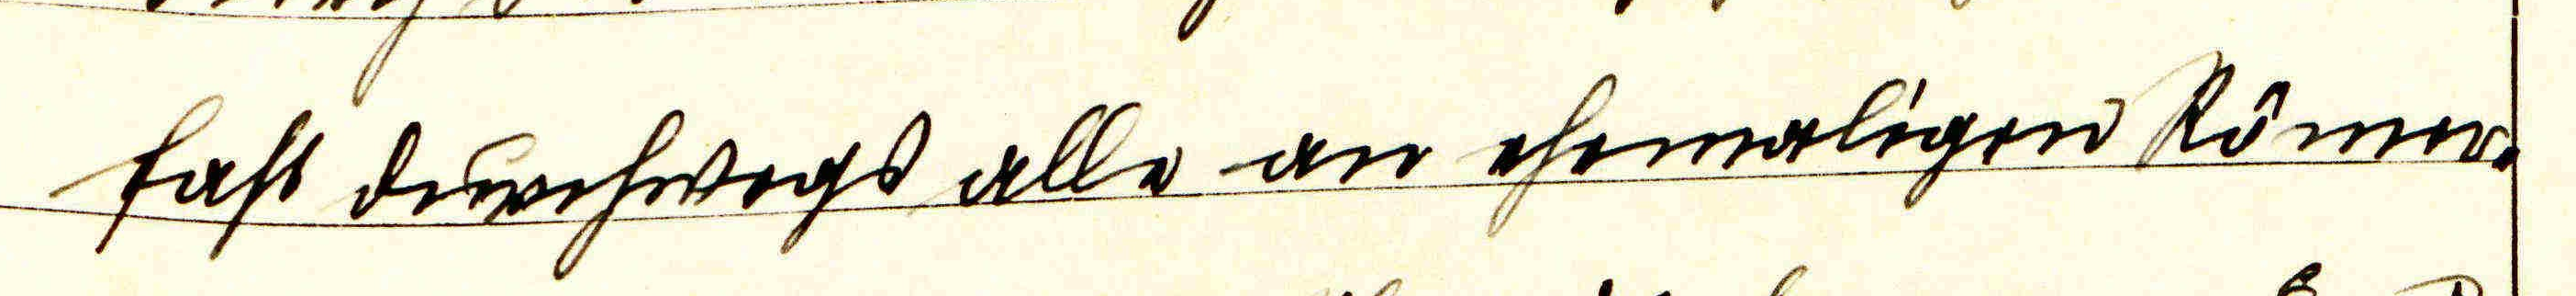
fast durchwegs alle an ehemaligen Römer-
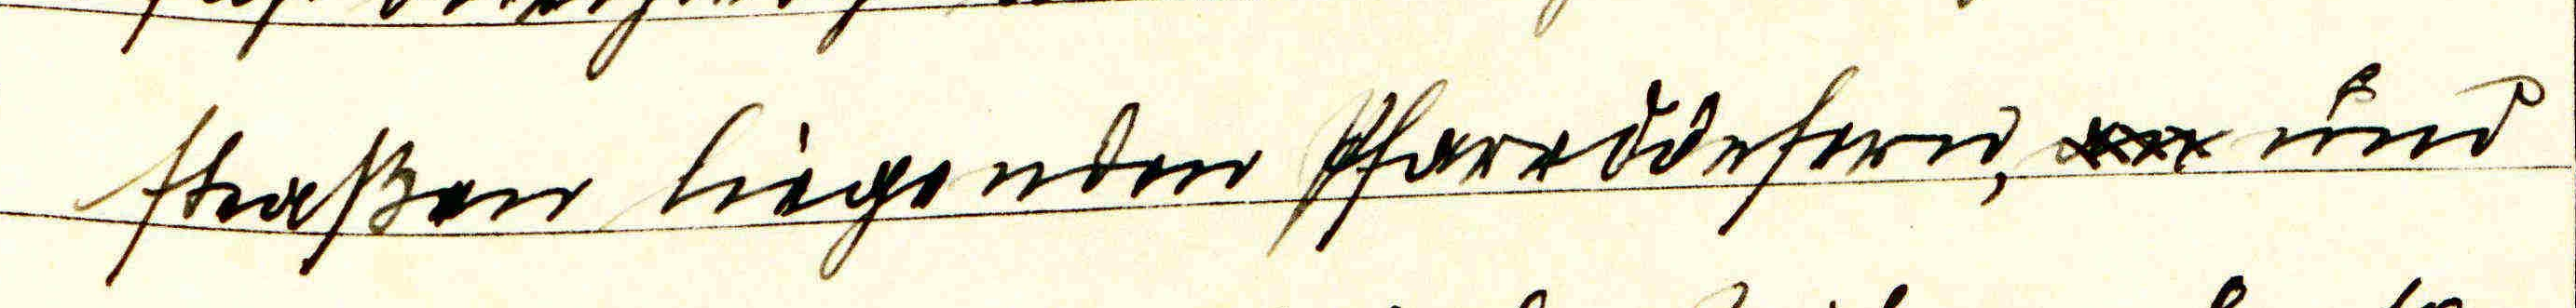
straßen liegenden Pfarrdörfern, und
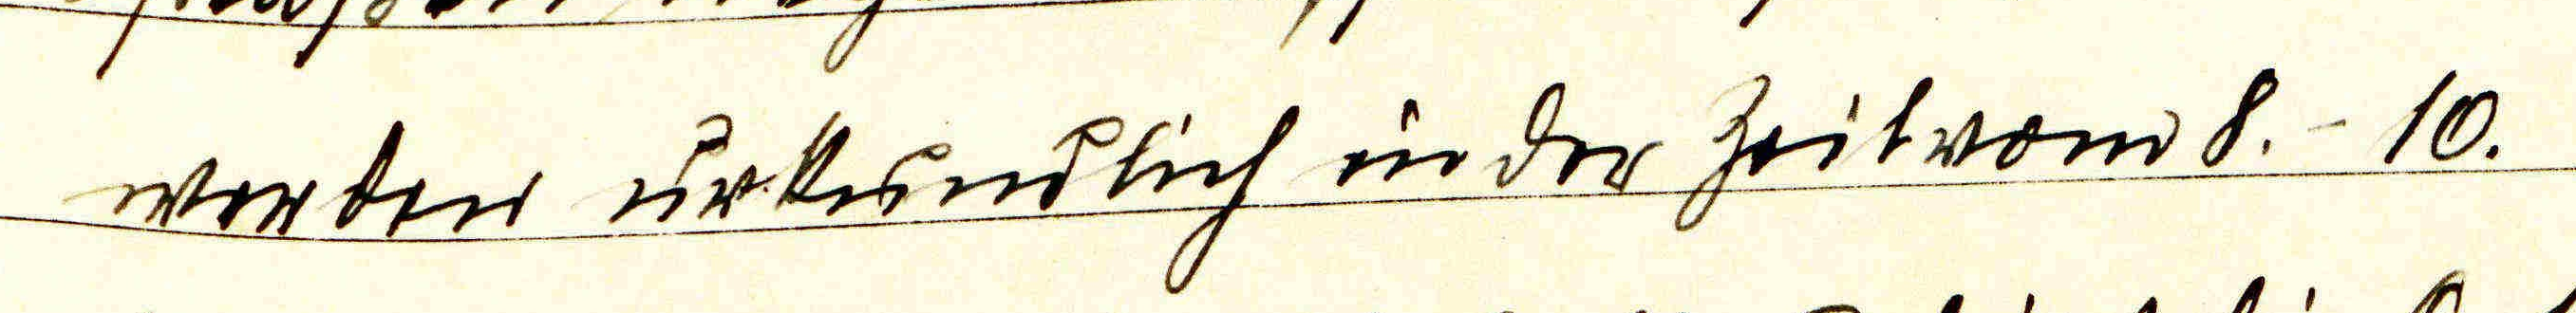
werden urkundlich in der Zeit vom 8. – 10.
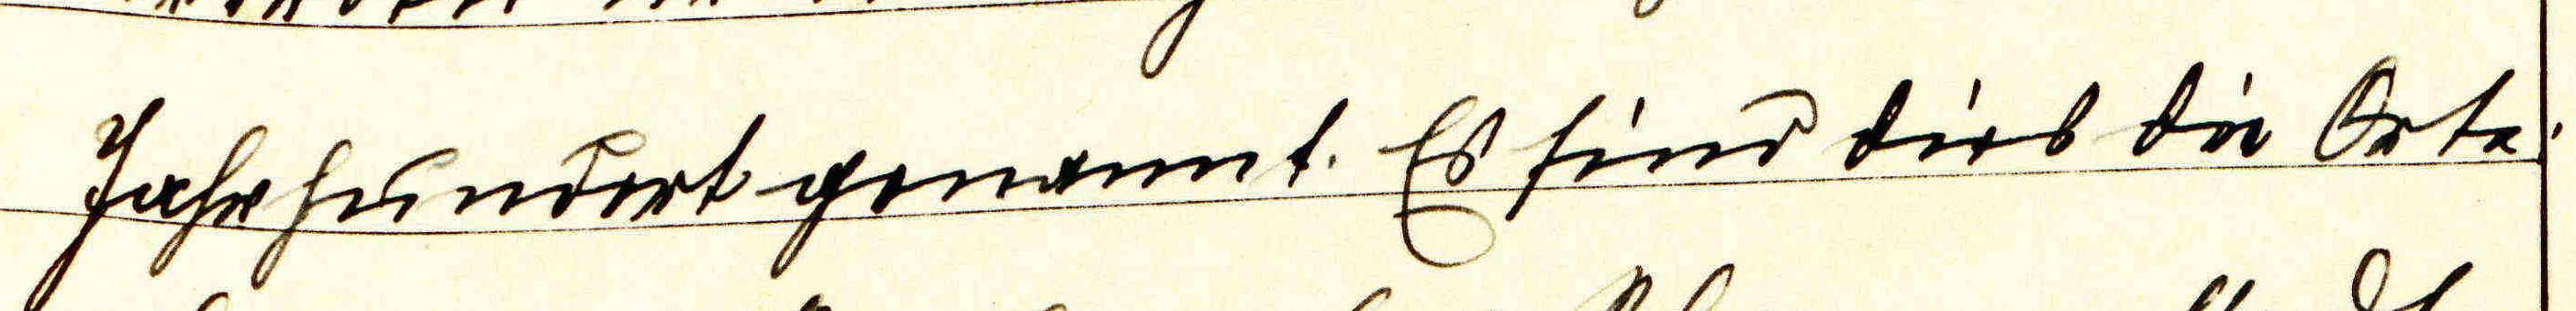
Jahrhundert genannt. Es sind dies die Orte
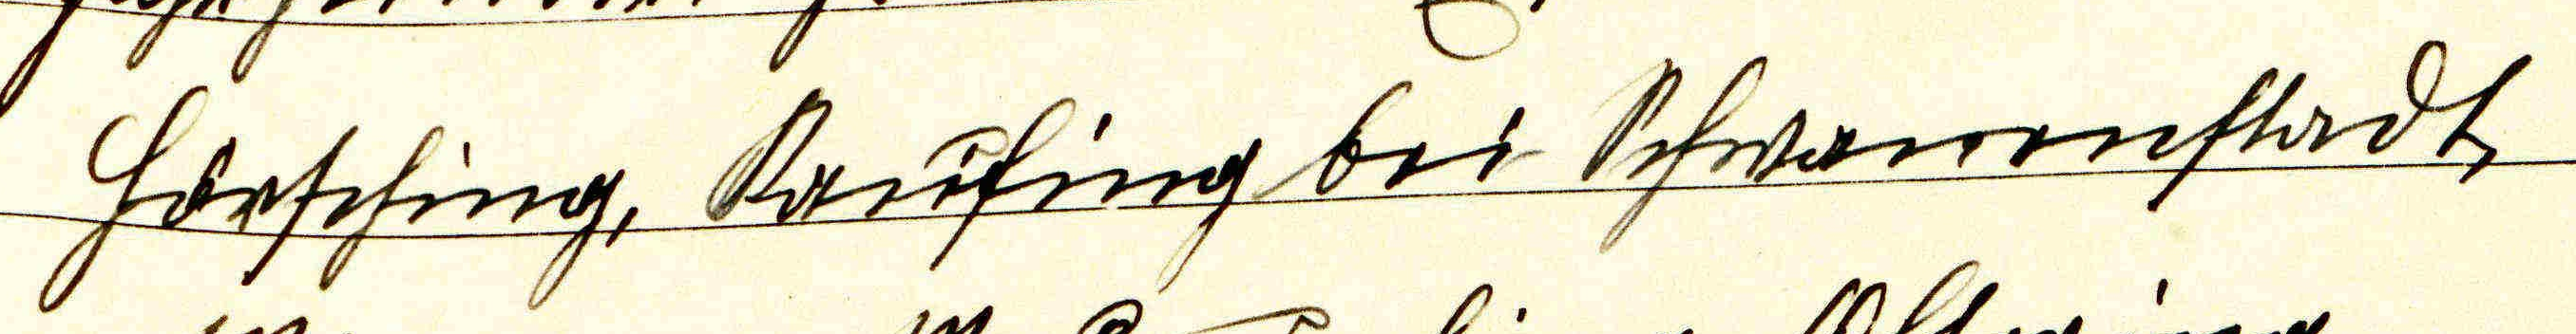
Hörsching, Kaufing bei Schwanenstadt,
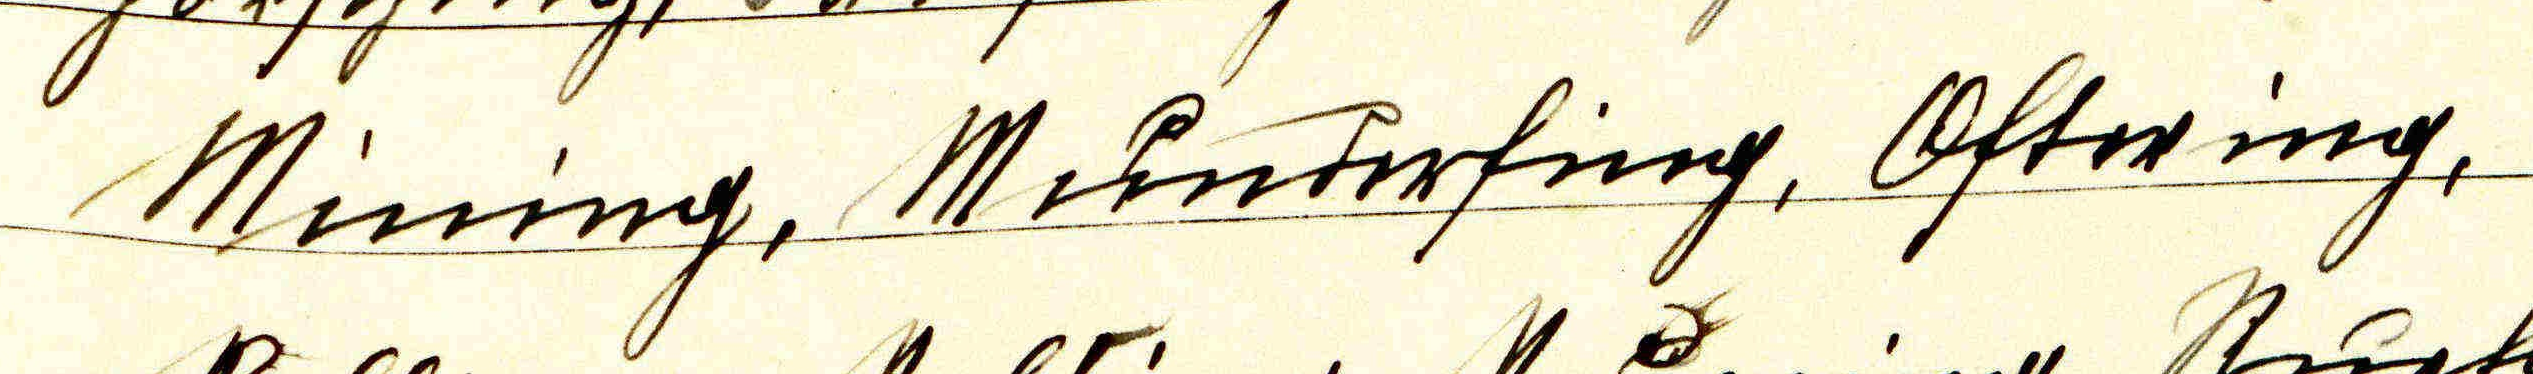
Mining, Munderfing, Oftering,
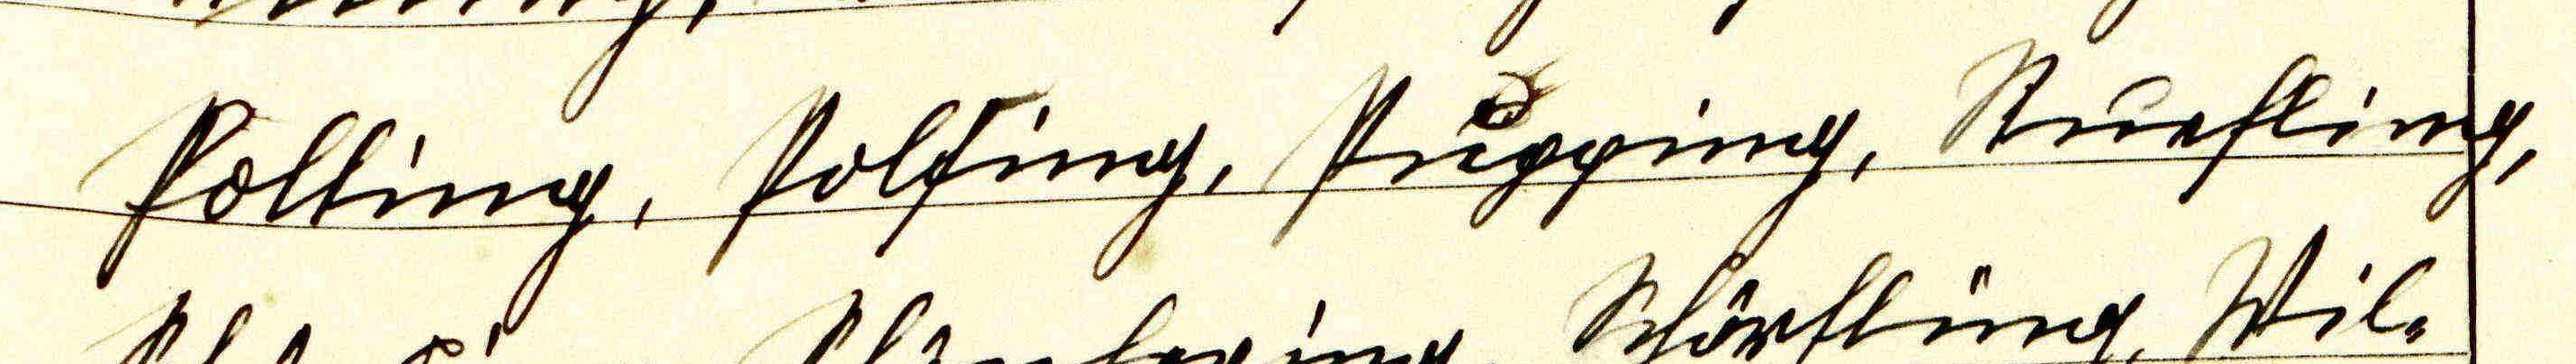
Polling, Polfing, Pupping, Ruefling,
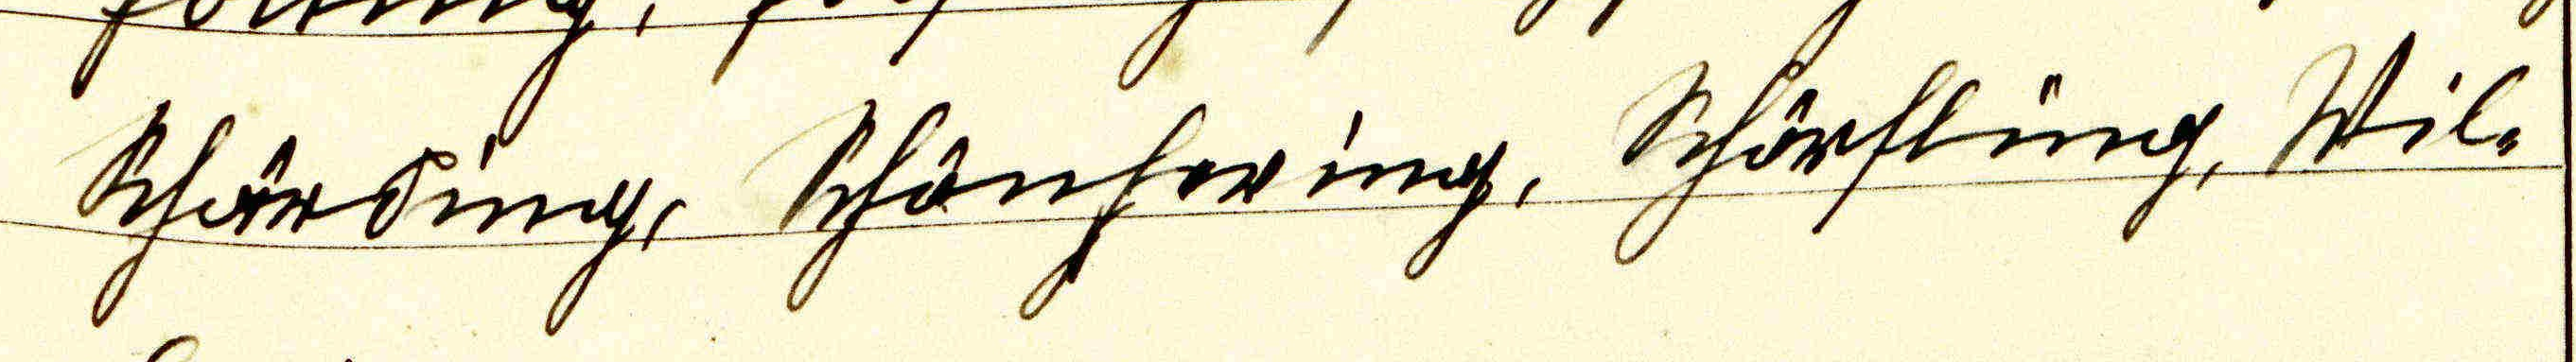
Schärding, Schönhering, Schörfling, Wil-
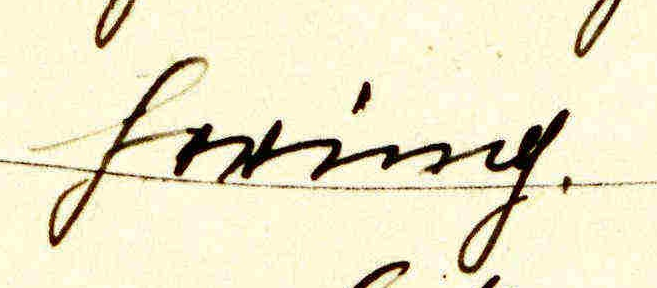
hering.
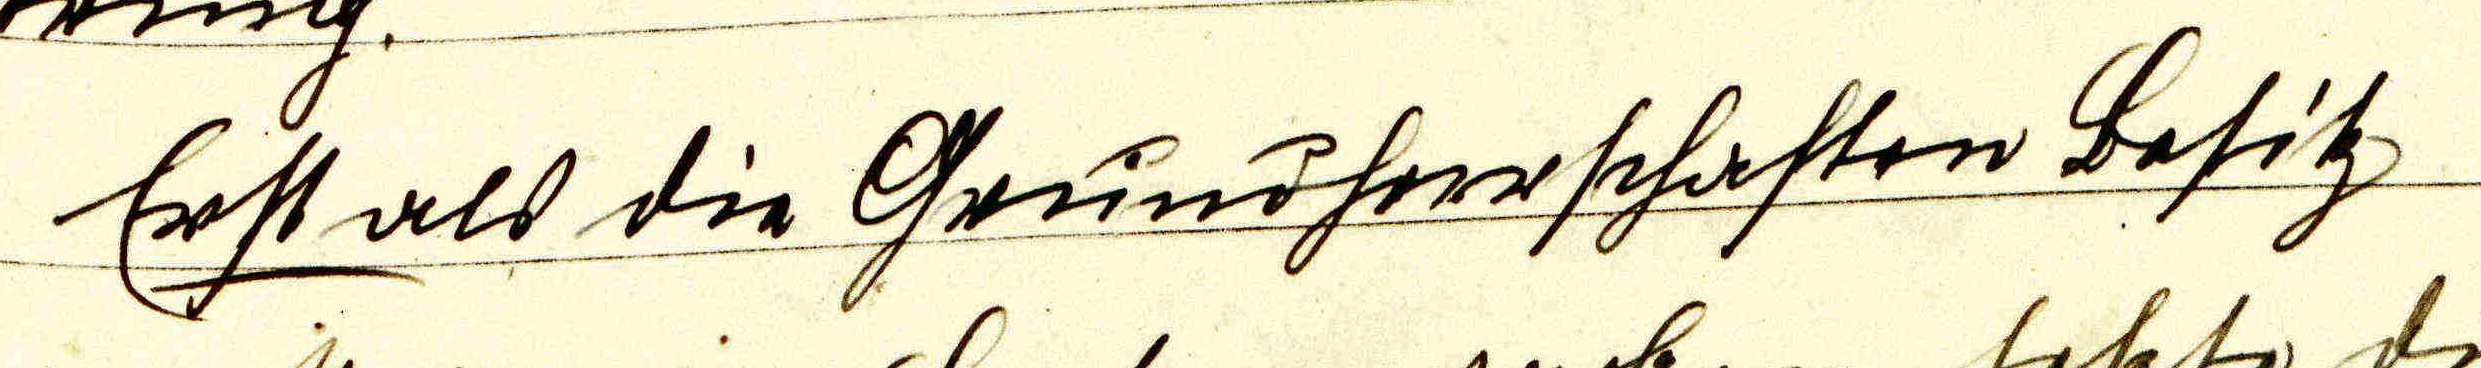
Erst als die Grundherrschaften Besitz
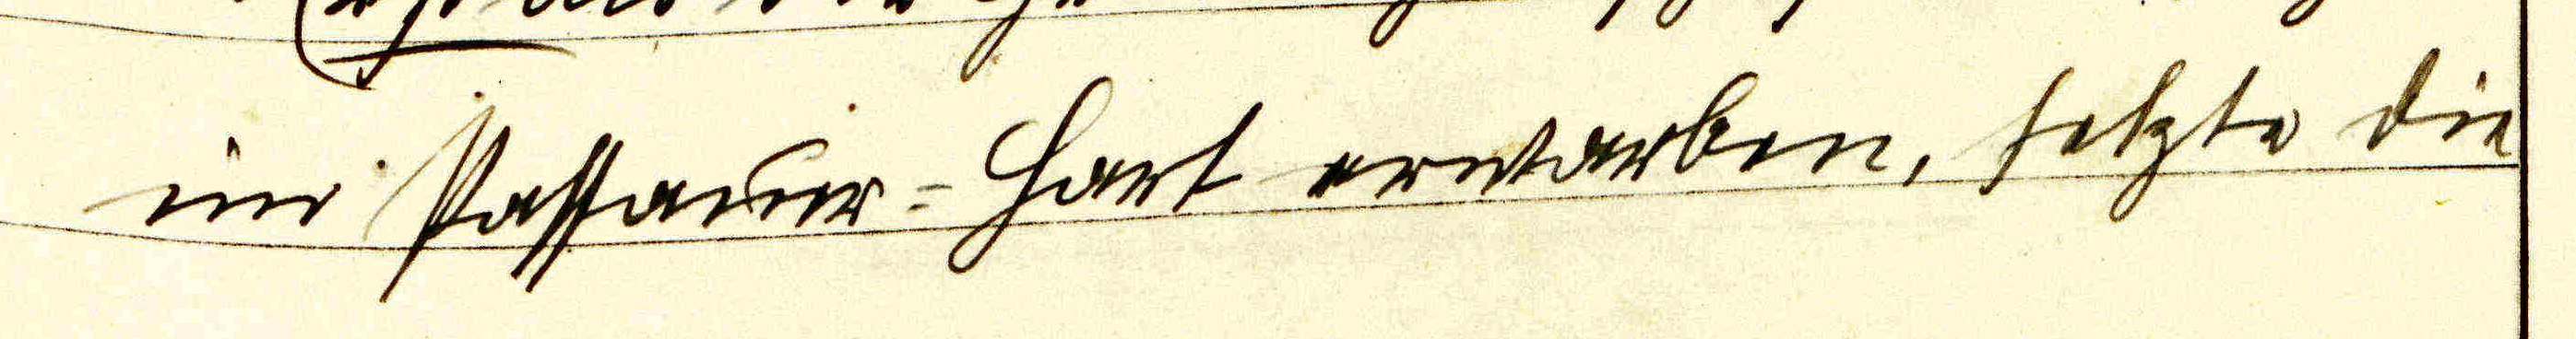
im Passauer-Hart erwarben, setzte die
